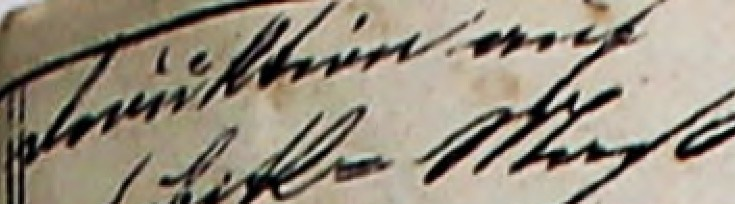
Reduktion auf
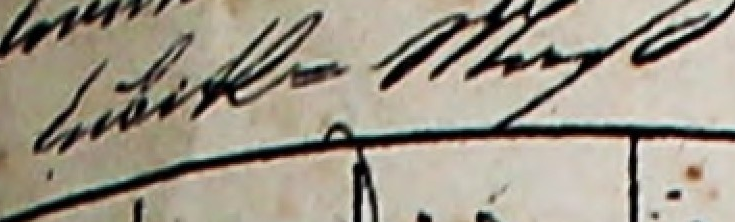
Cubik= Maß
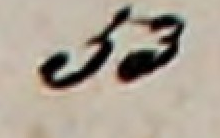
53
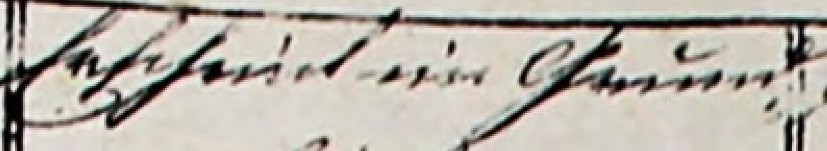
Erscheint im Grund„
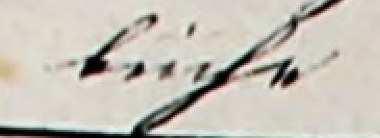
buche
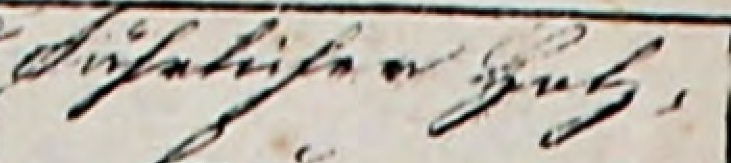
Jährlicher Holz„
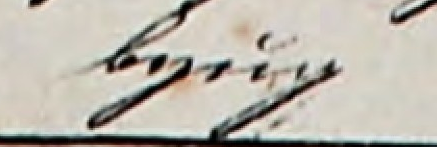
bezug
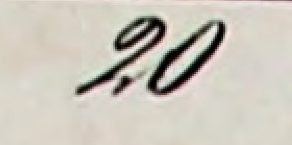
20
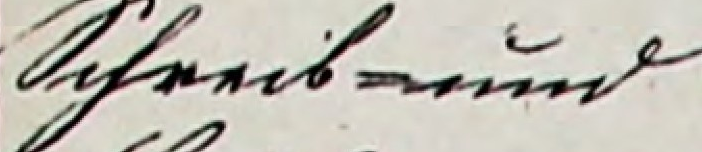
Schreib = und
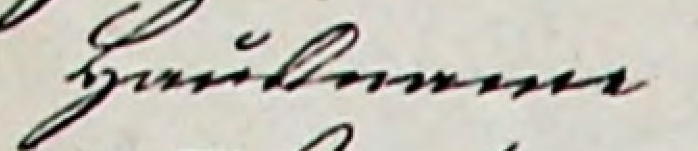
Hausmann
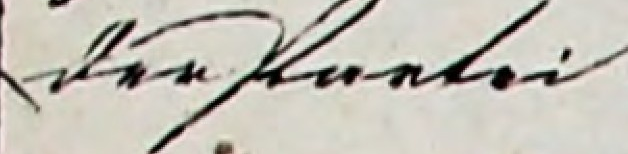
der Partei
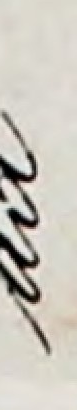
ad
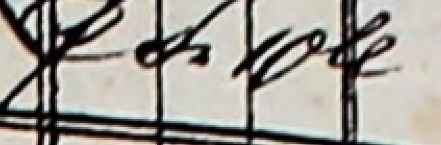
???
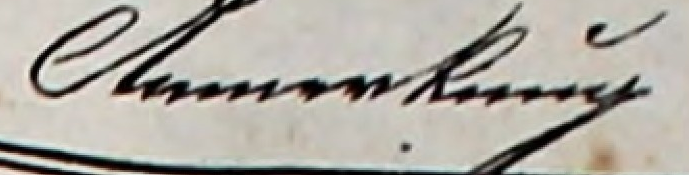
Anmerkung
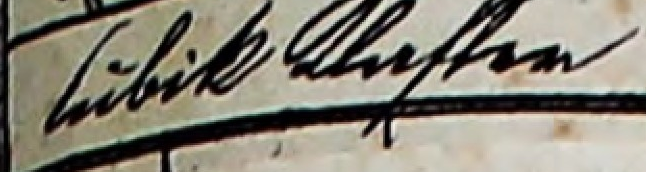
Cubik Klafter
